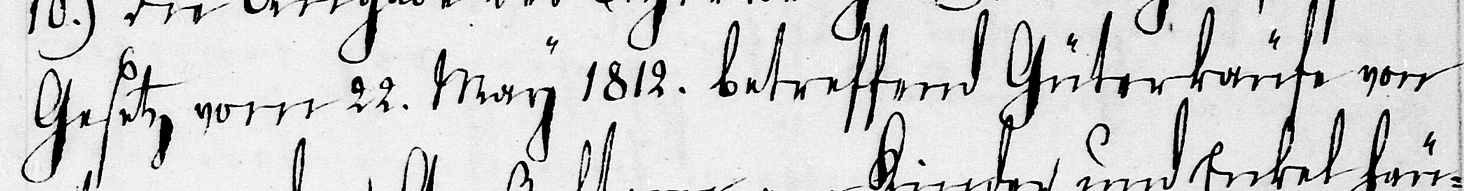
Gesetz vom 22. May 1812. betreffend Güterkäufe von
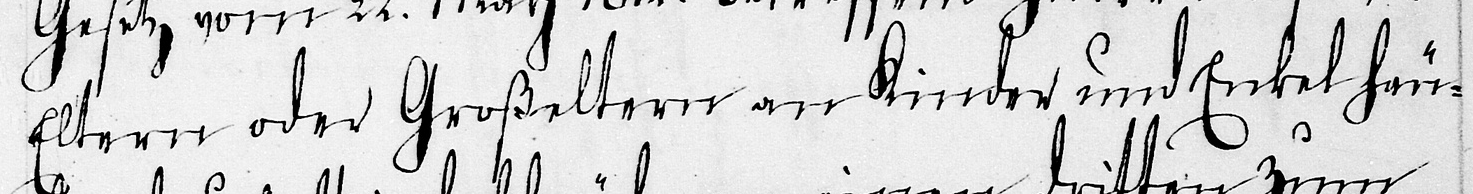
Eltern oder Großeltern an Kinder und Enkel häu¬
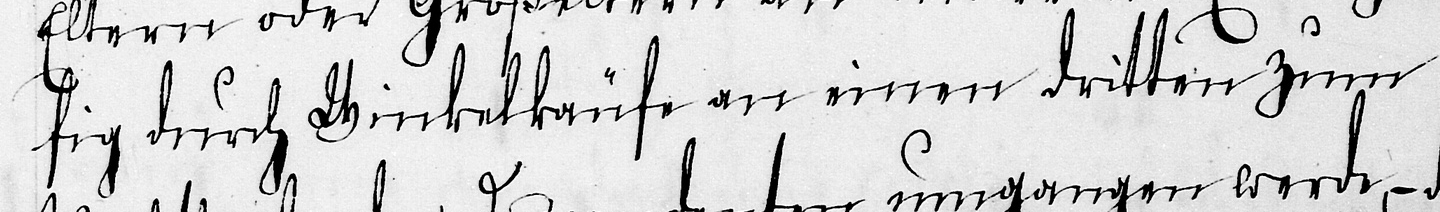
fig durch Winkelkäufe an einen dritten zum
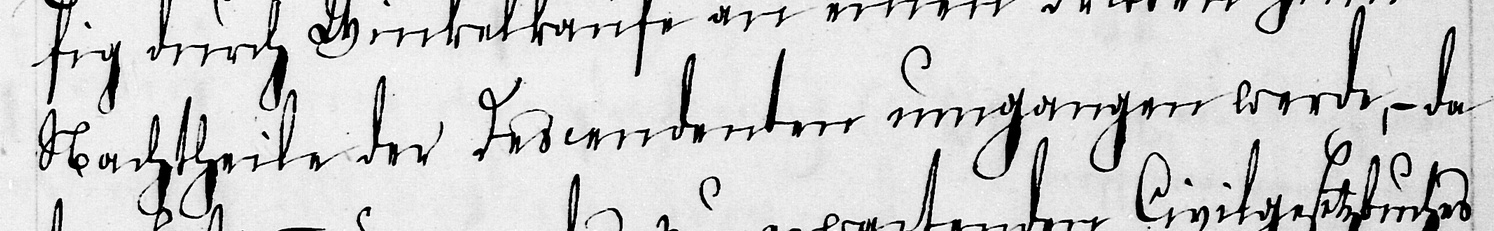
Nachttheile der Descendenten umgangen werde, – da
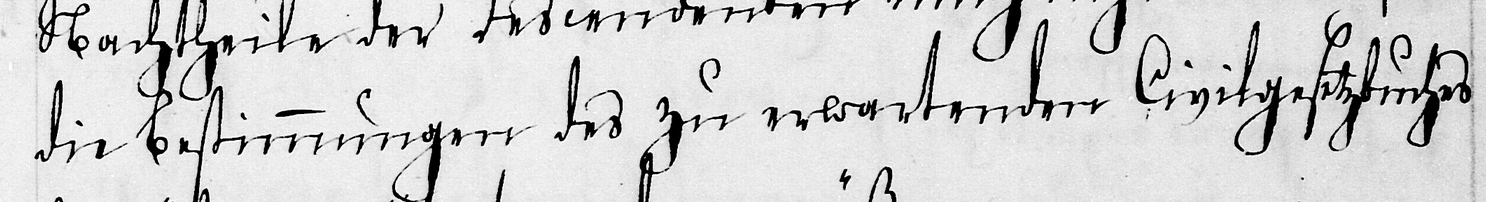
die Bestimmungen des zu erwartenden Civilgesetzbuches
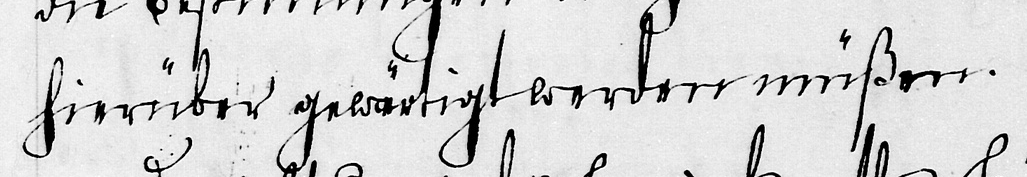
hierüber gewärtigt werden müßen.
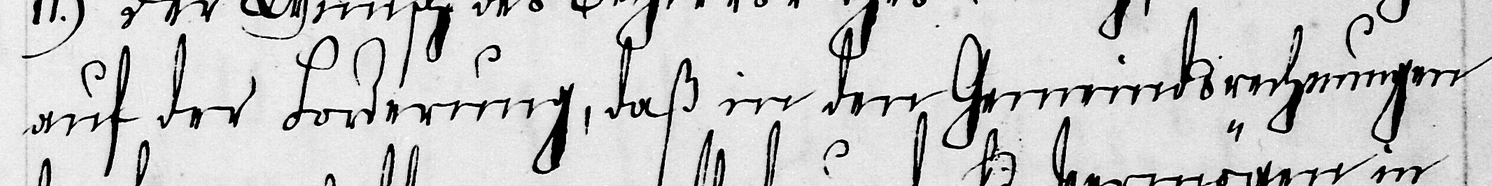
auf der Forderung, daß in den Gemeindsrechnungen
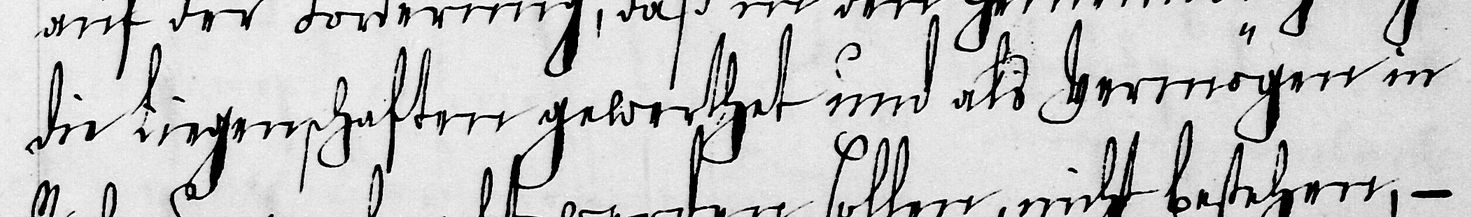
die Liegenschaften gewerthet und als Vermögen in
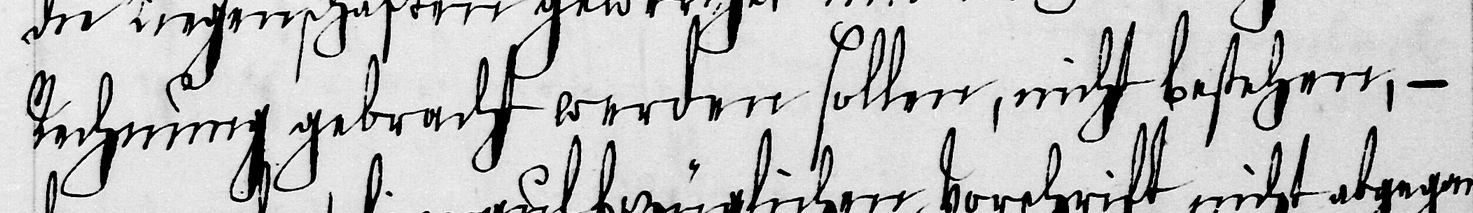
Rechnung gebracht werden sollen, nicht bestehen, –
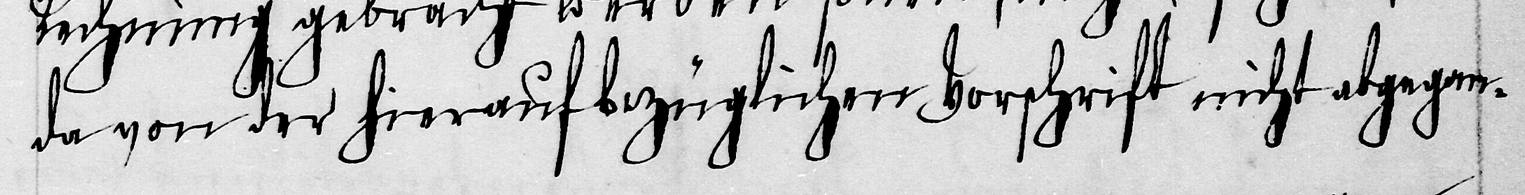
da von der hierauf bezüglichen Vorschrift nicht abgegan-
